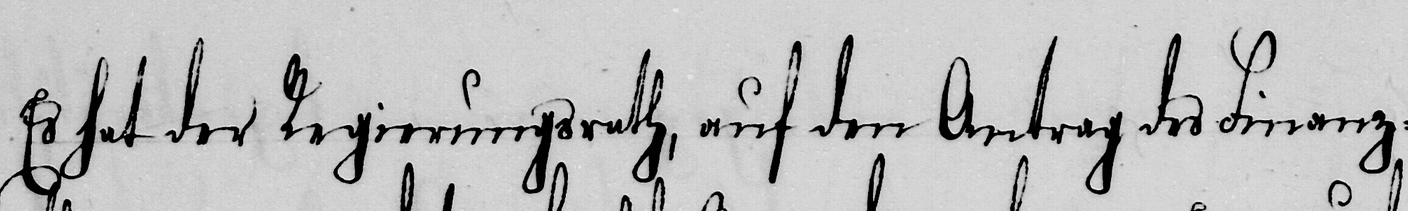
Es hat der Regierungsrath, auf den Antrag des Finanz¬
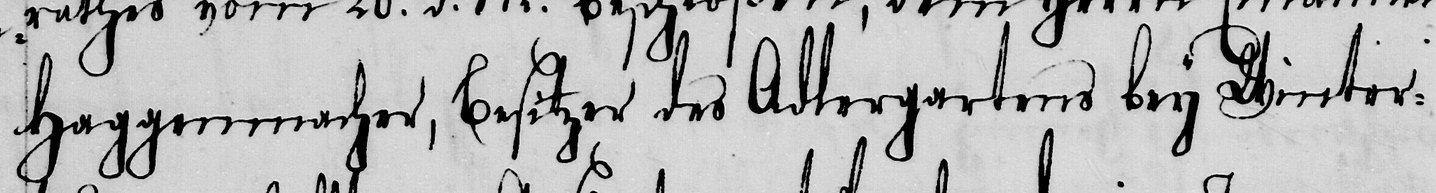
Haggenmacher, Besitzer des Adlergartens bey Winter¬
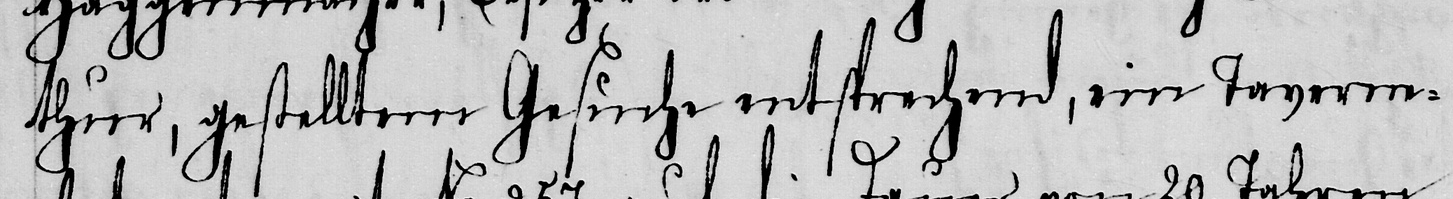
thur, gestelltem Gesuche entsprechend, ein Tavern¬
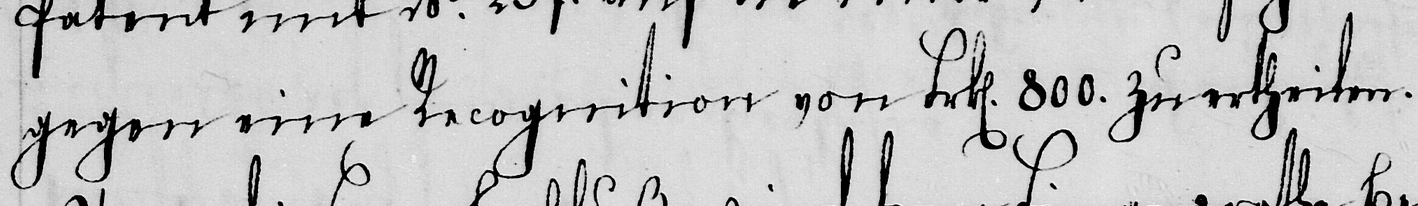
gegen eine Recognition von Frk[en]. 800. zu ertheilen.
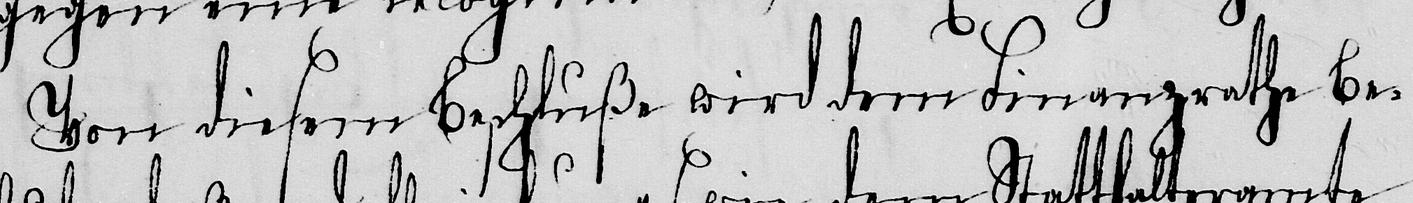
Von diesem Beschluße wird dem Finanzrathe Be¬
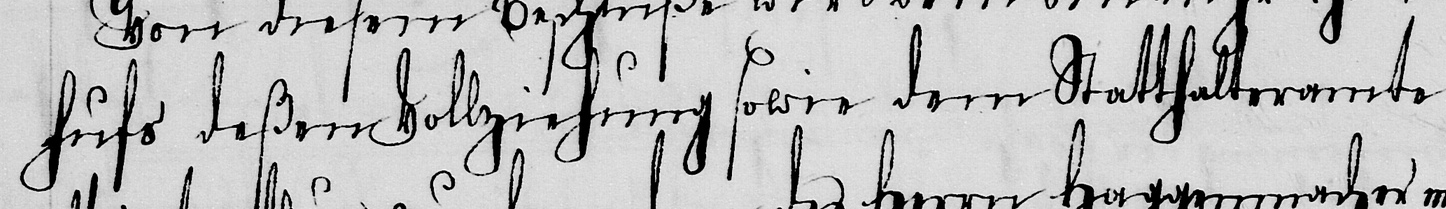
hufs deßen Vollziehung sowie dem Statthalteramte
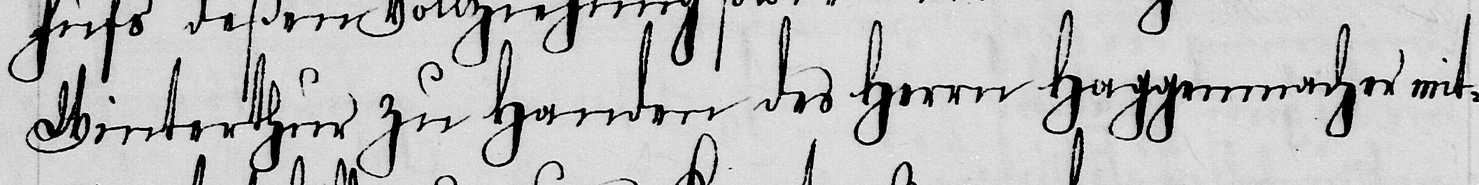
Winterthur zu Handen des Herrn Haggenmacher mit¬
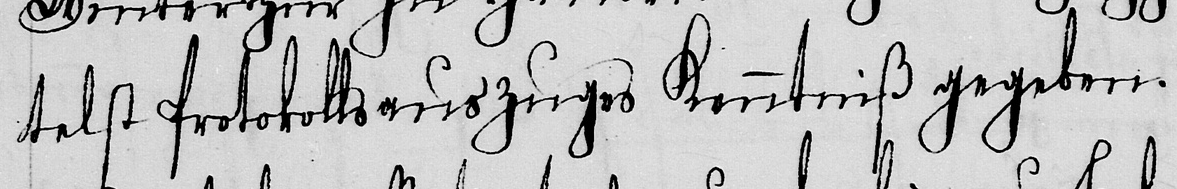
telst Protokollsauszuges Kenntniß gegeben.
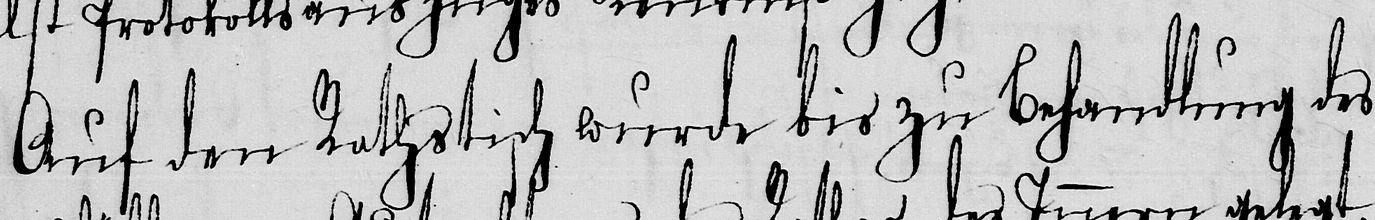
Auf den Rathstisch wurde bis zu Behandlung des
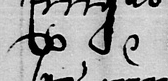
d. M.
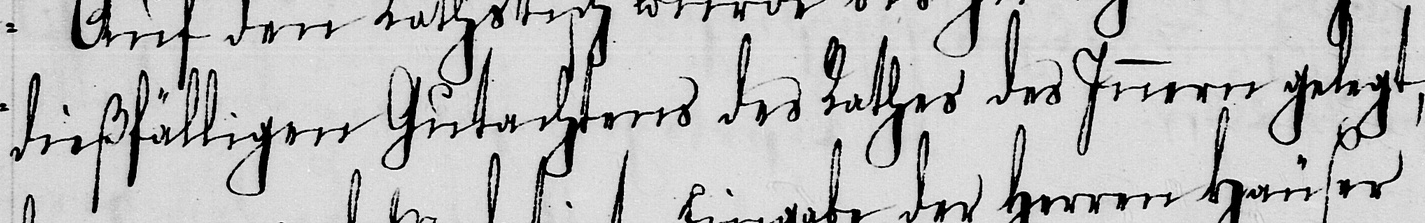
dießfälligen Gutachtens des Rathes des Innern gelegt,
